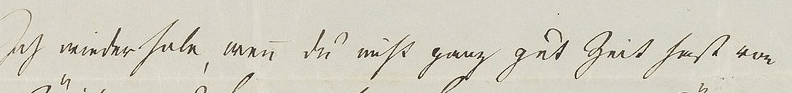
Ich wiederhole, wenn Du nicht ganz gut Zeit hast von
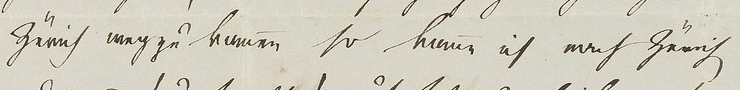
Zürich wegzukommen so komme ich nach Zürich
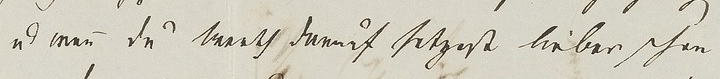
u wenn Du Werth darauf setzest lieber schon
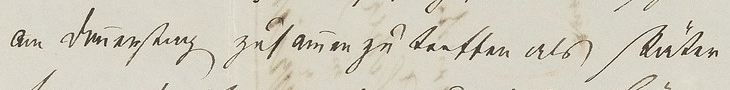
am Donnerstag zusammenzutreffen als später
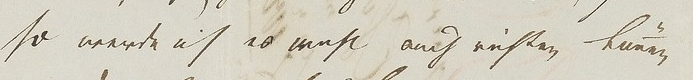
so werde ich es wohl auch richten können
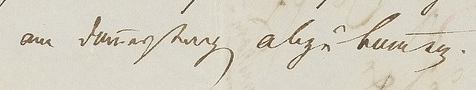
am Donnerstag abzukommen.
